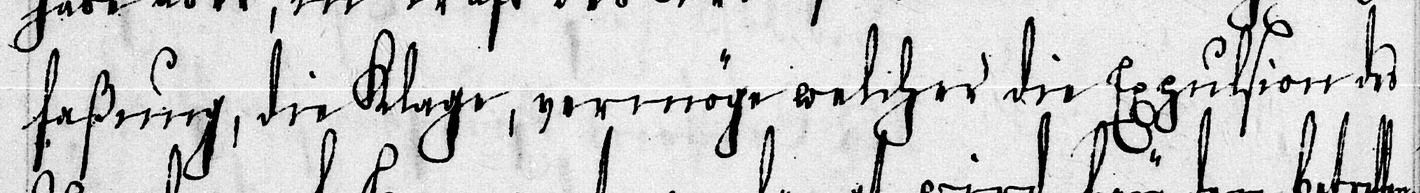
rfaßung, die Klage, vermöge welcher die Expulsion des
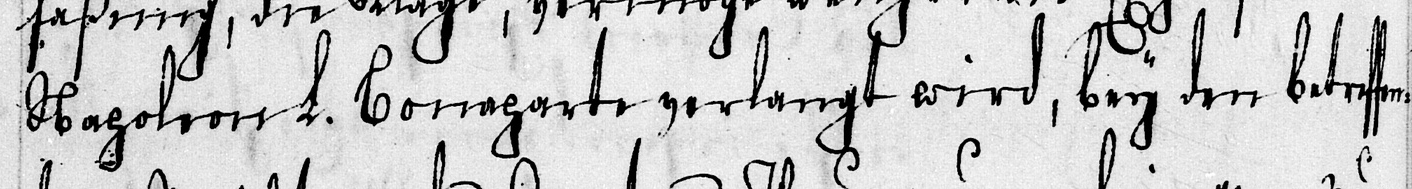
Napoleon L. Bonaparte verlangt wird, bey den betref¬
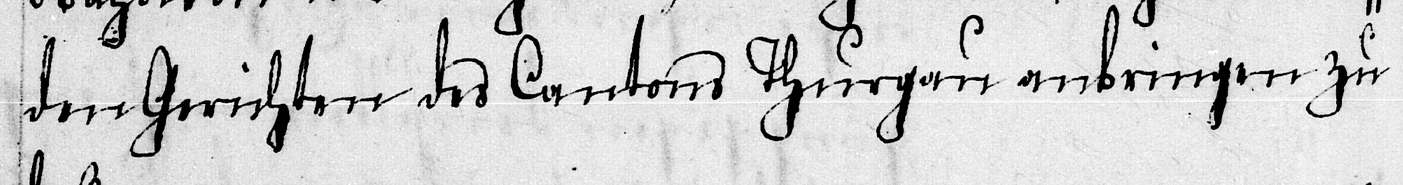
den Gerichten des Cantons Thurgau anbringen zu
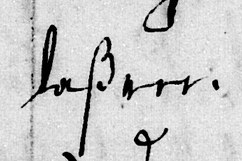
laßen.
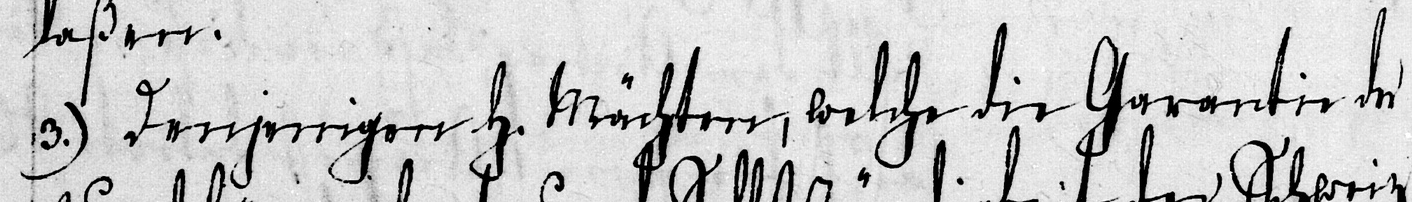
3.) Denjenigen H. Mächten, welche die Garantie der
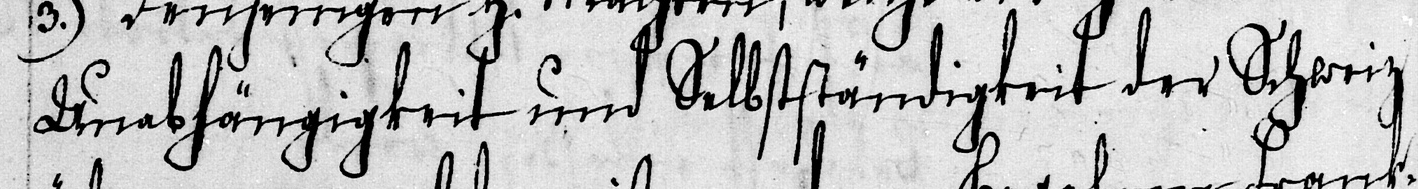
Unabhängigkeit und Selbständigkeit der Schweiz
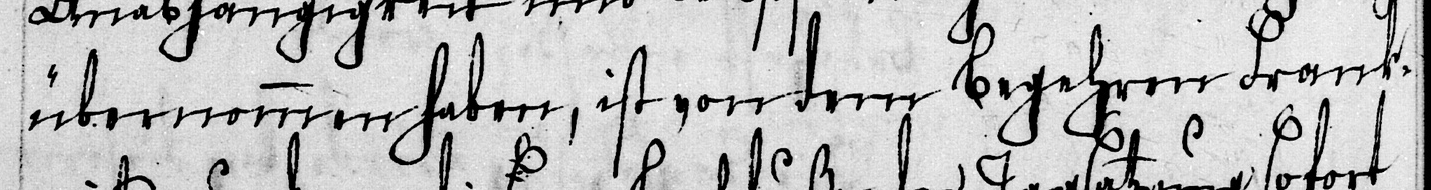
übernommen haben, ist von dem Begehren Frank¬
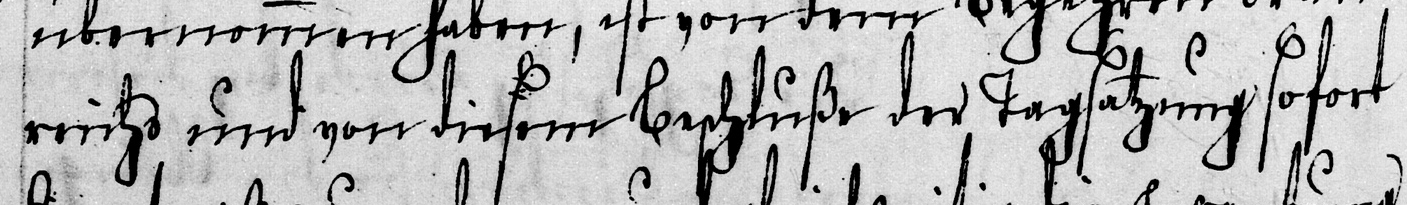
reichs und von diesem Beschluße der Tagsatzung sofort
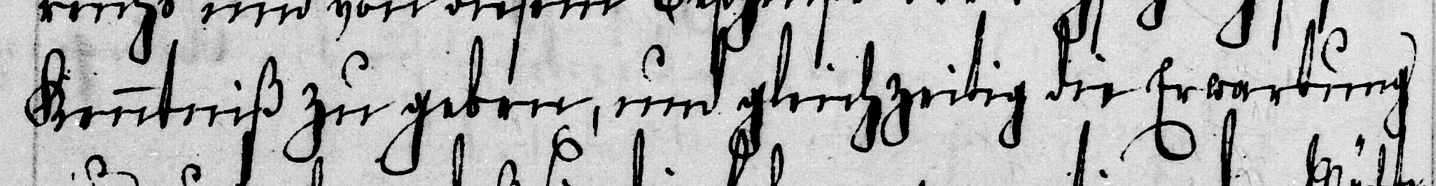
Kenntniß zu geben, und gleichzeitig die Erwartung
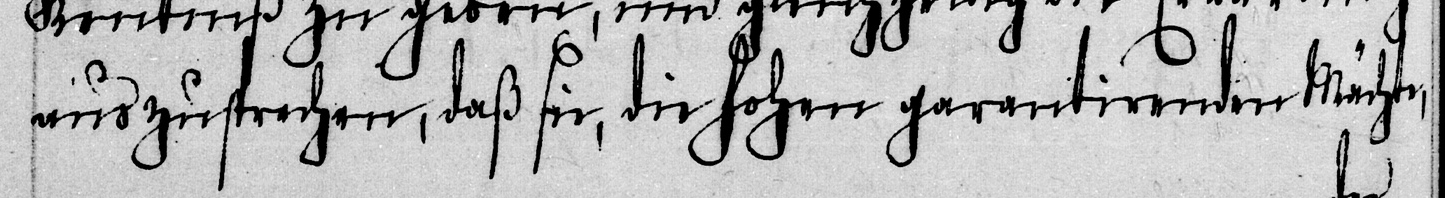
auszusprechen, daß sie, die hohen garantirenden Mächte,
